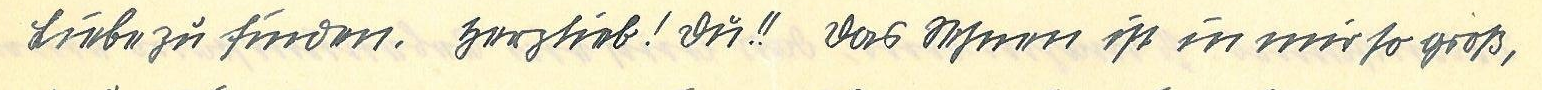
Liebe zu finden. Herzlieb! Du!! Das Sehnen ist in mir so groß,
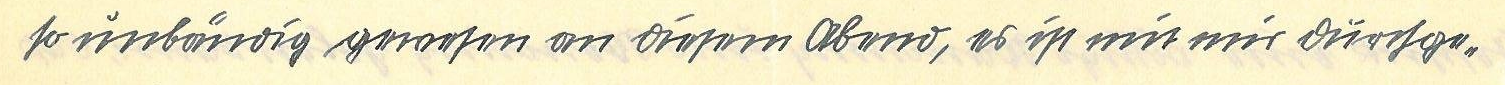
so unbändig gewesen an diesem Abend, es ist mit mir durchge¬
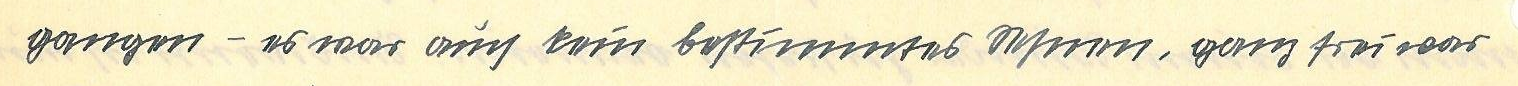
gangen – es war auch kein bestimmtes Sehnen, ganz frei war
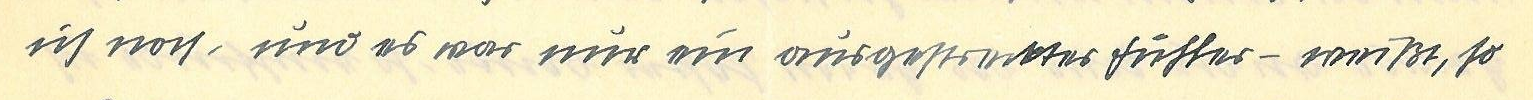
ich noch, und es war nur ein ausgestreckter Fühler – weißt, so
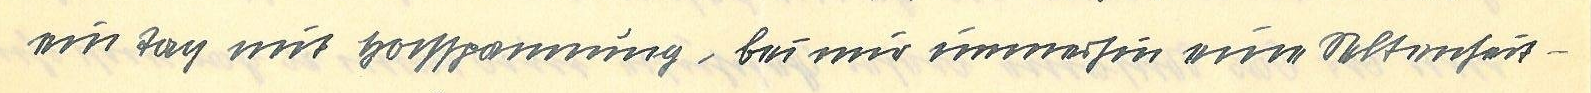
ein Tag mit Hochspannung, bei mir immerhin eine Seltenheit –
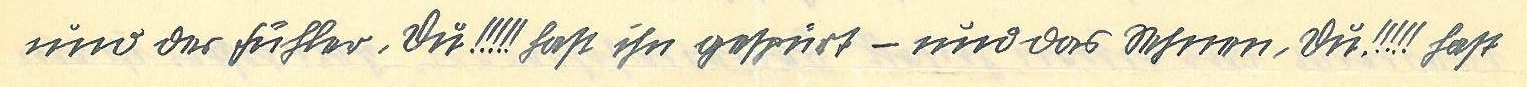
und der Fühler, Du!!!!! hast ihn gespürt – und das Sehnen, Du!!!!! hast
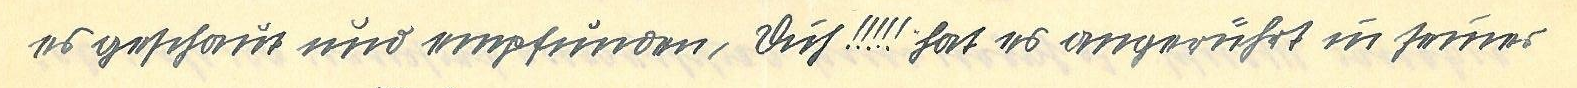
es geschaut und empfunden, Dich!!!!! hat es angerührt in seiner
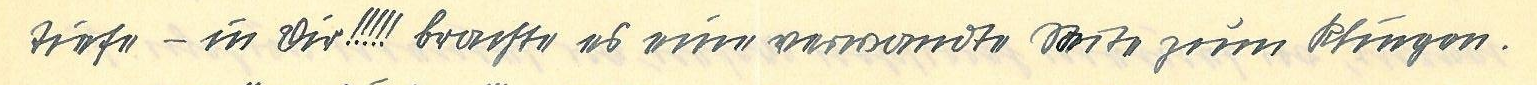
Tiefe – in Dir!!!!! brachte es eine verwandte Seite zum Klingen.
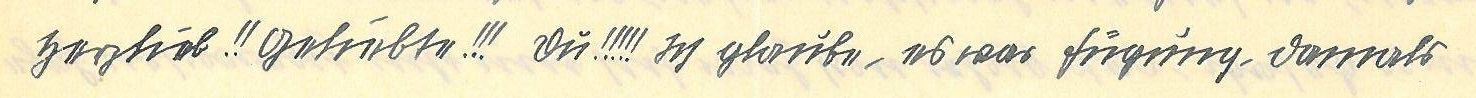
Herzlieb!! Geliebte!!! Du!!!!! Ich glaube, es war Fügung, damals
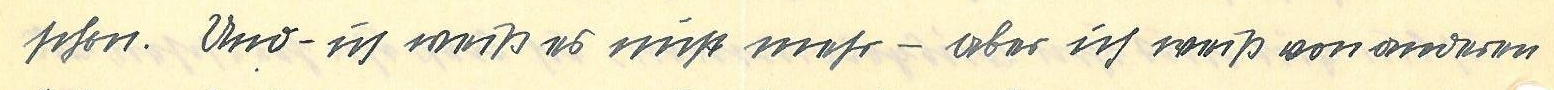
schon. Und – ich weiß es nicht mehr – aber ich weiß von anderen
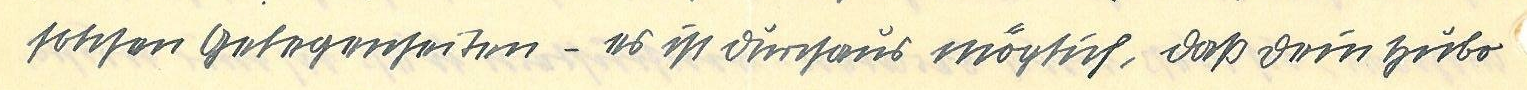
solchen Gelegenheiten – es ist durchaus möglich, daß Dein Hubo
